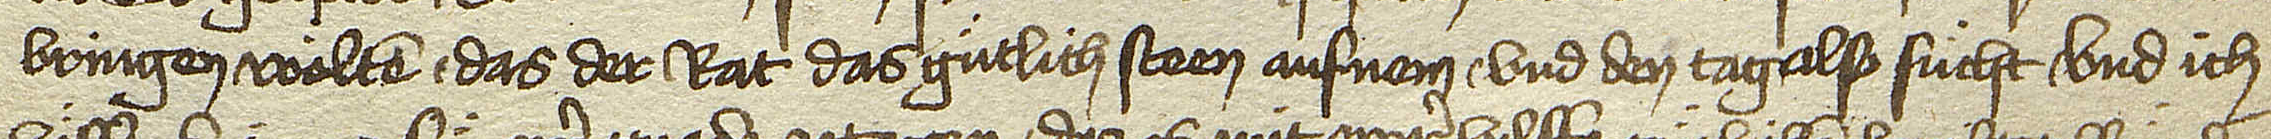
bringen wölte / das der Rat das gütlich ſteen aufnem / vnd den tag alſo ſücht / vnd ich
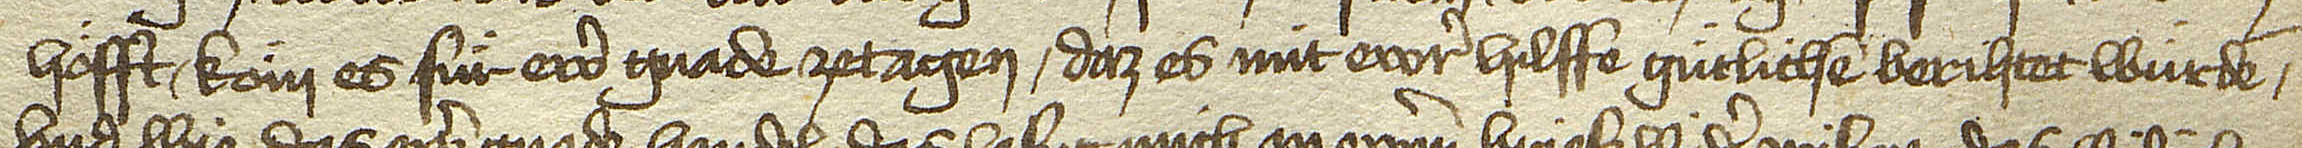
hofft / köm es für ew* gnade cʒetagen / daʒ es mit ewr* hilffe gütliche* verihtet würde /
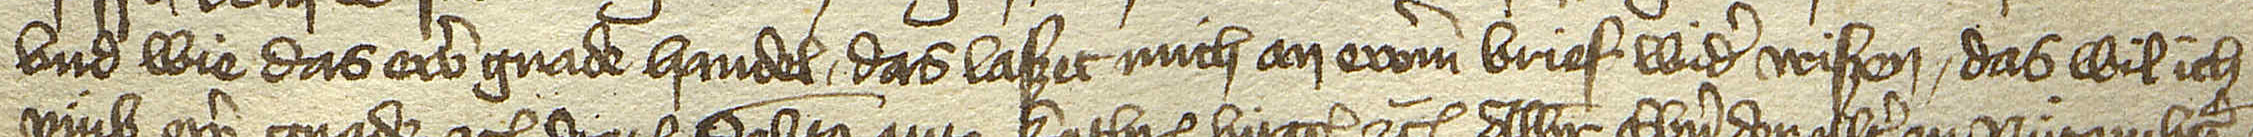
vnd wie das ew* gnade handel / das laſʒet mich an ewm* brief wid* wiſʒen / das wil ich
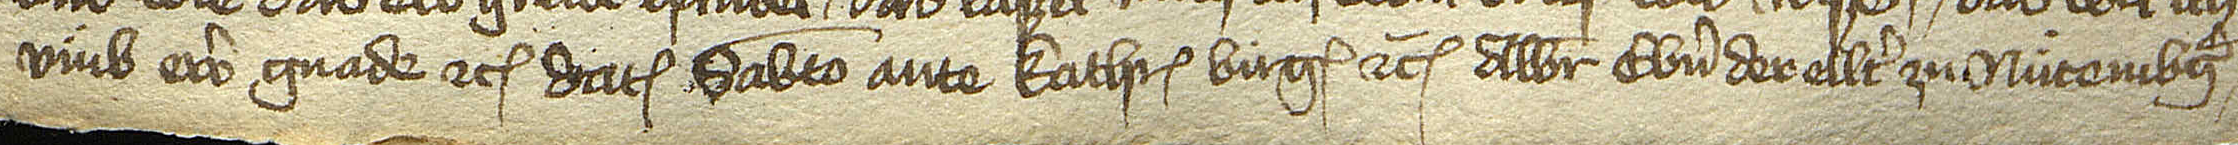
v̈mb ew* gnade ec* dat* Sabto* ante Kathr* virg* ec* Albr* Ebn* der ellt* ʒu Nürembg*
